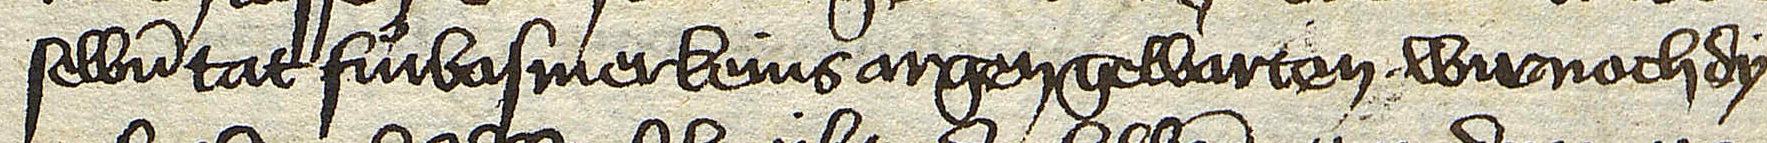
ſelb*n tat fürbaſmer keins angen gewarten . wir noch dy
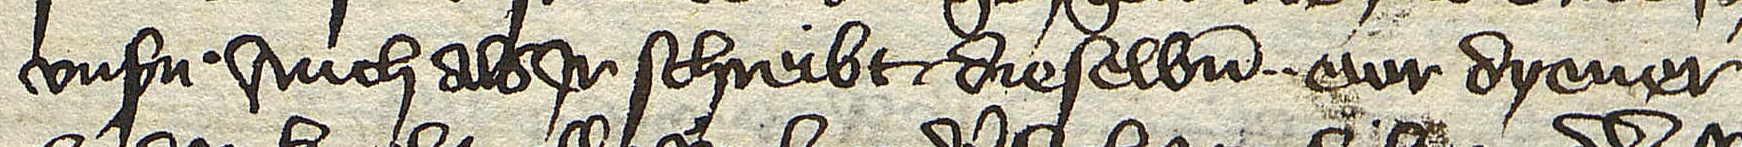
vnſ*n . Auch als Ir ſchreibt / dieſelb*n . ewr dyener
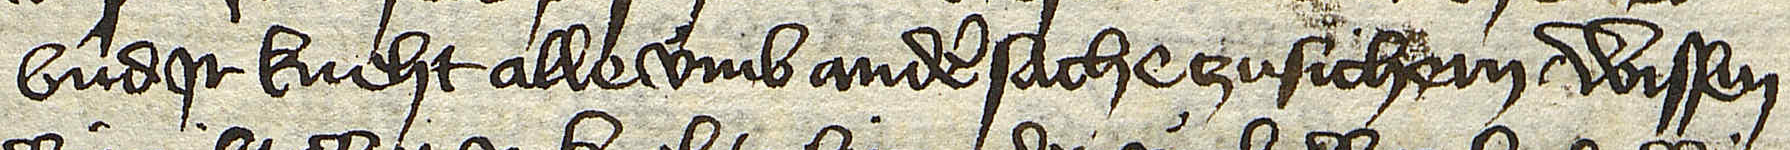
vnd Ir kneht alle v̈mb and* ſache cʒuſichern / Wiſſen
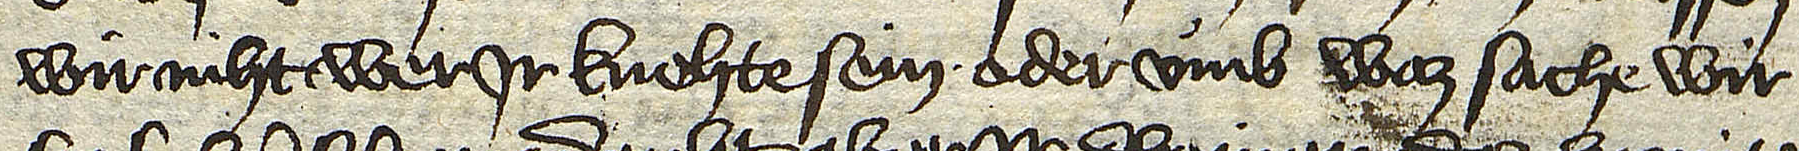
wir niht / wer Ir knehte ſein . oder v̈mb waʒ ſache wir
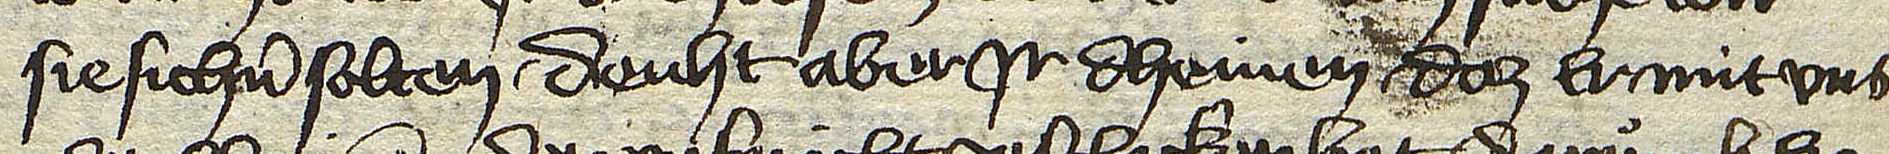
ſie ſich*n ſolten / Deuht aber Ir dheinen / daʒ Er mit vns
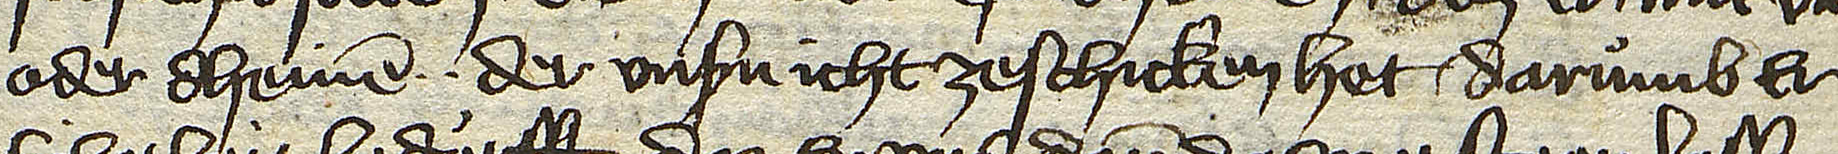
od* dheine* ~ der vnſ*n icht ʒeſchicken het / darümb Er
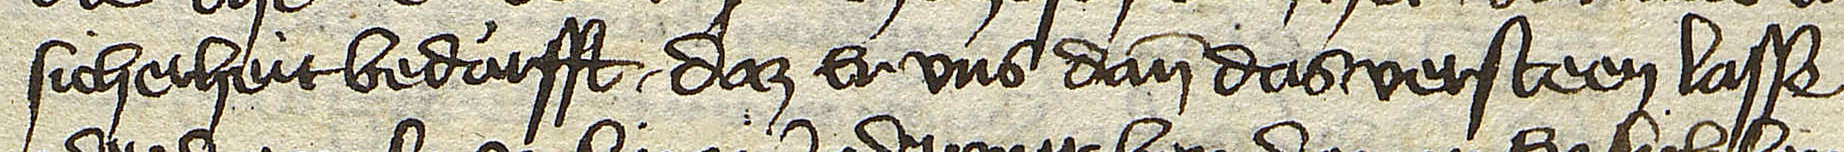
ſicherheit bedörfft / daʒ er vns dan* das verſteen laſſe
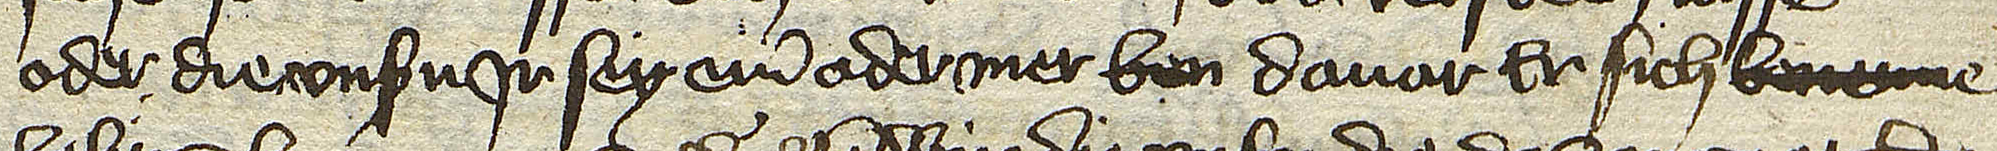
od* die vnſ*n Ir ſey ein* oder mer von dauor Er ſich benenne
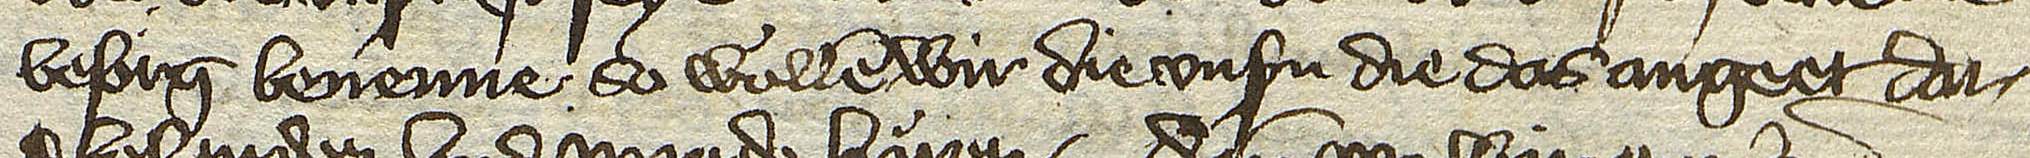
beſörg benenne So wölle* wir die vnſ*n die das angeet dar*
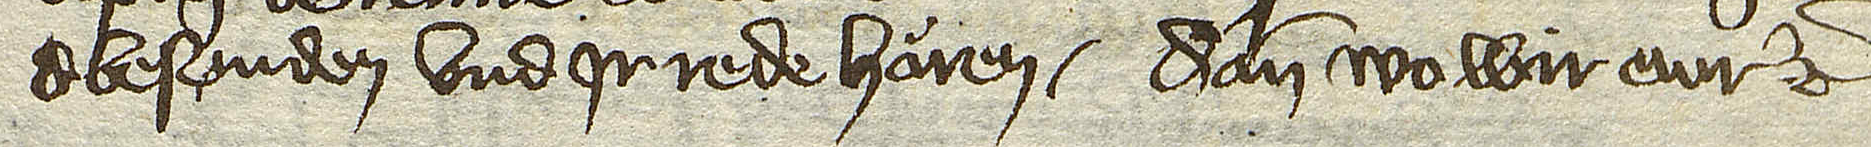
d beſenden vnd Ir rede hören / dan* wo wir ewr* ec*
